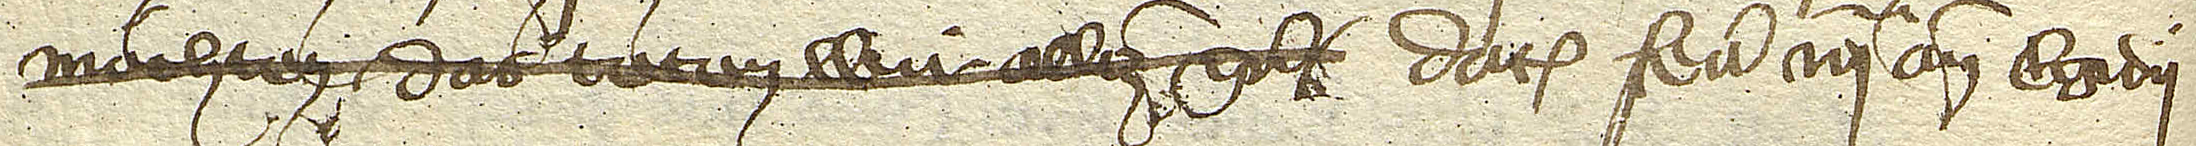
möchten / das teten wir allcʒ* gn* / dat* fea* iii* an* Egidii
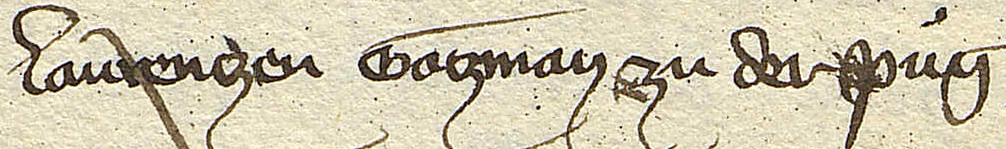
Laurencʒen Gocʒman cʒu der Pürg
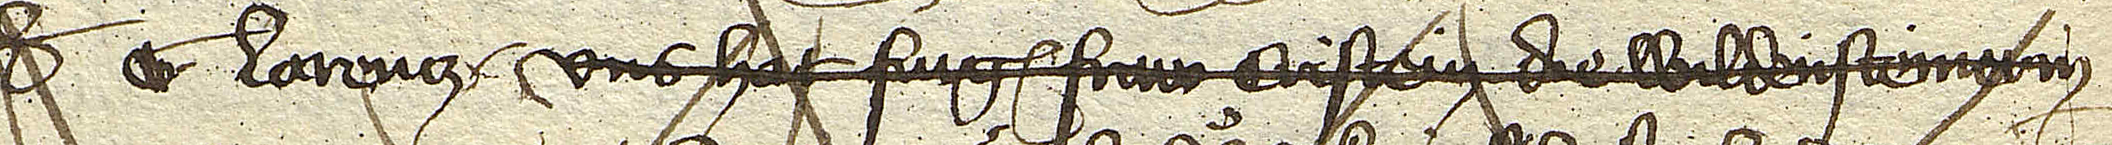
L* G Larencʒ / vns hat fürg* fraw Criſtein die wildenſteinerin
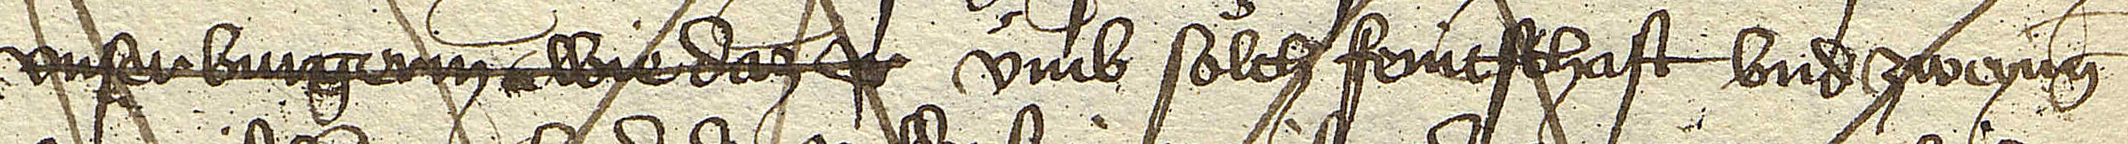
vnſer burgerin / wie daʒ Ir v̈mb ſölch feintſchaft vnd cʒweyug*
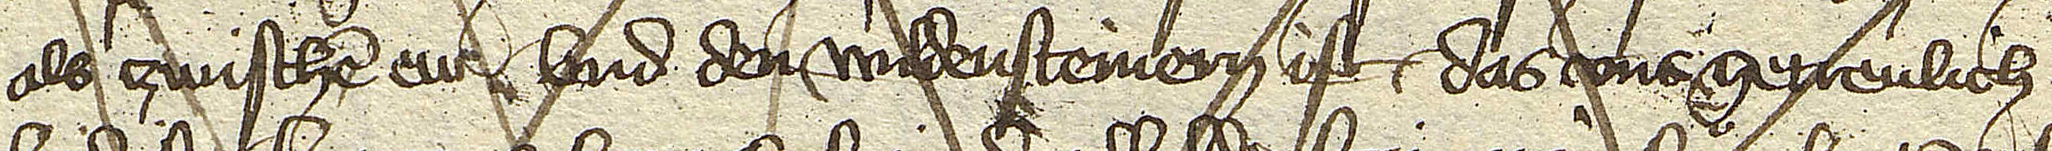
als cʒwiſche* ew / vnd den wildenſteinern iſt / das vns getreulich
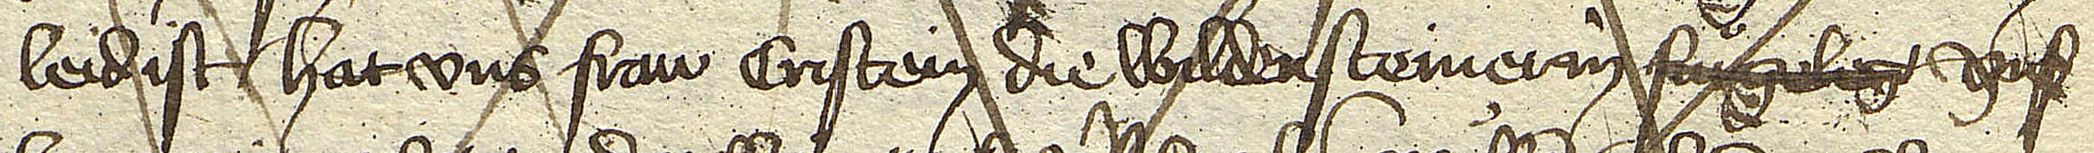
leid iſt / hat vns fraw Criſtein die wildenſteinerin fürgelegt vnſ*
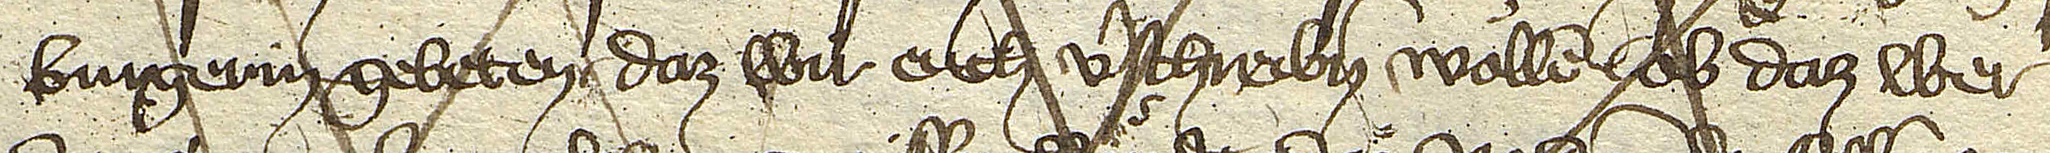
burgerin gebeten / daʒ wir euch v*ſchreibn* wölle* / ob daʒ wer
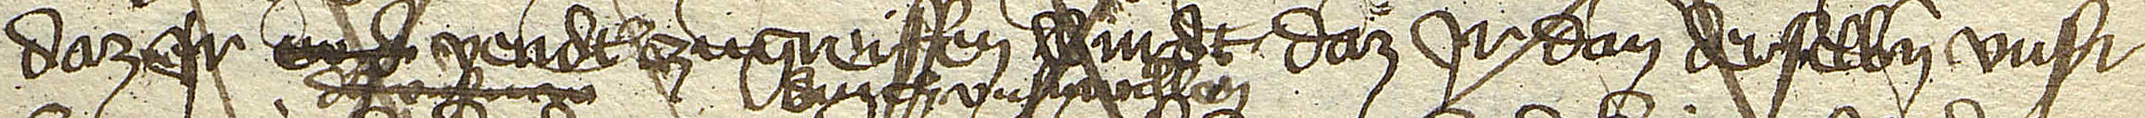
daʒ Ir ew d yendt* cʒu greiffen würdt / daʒ Ir dan* derſelbn* vnſ*r
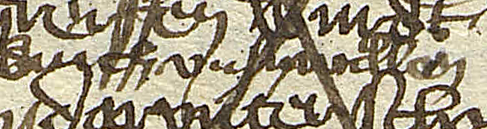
durch vnſ*n willen
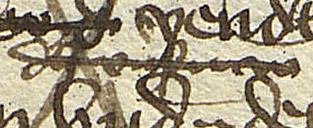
die vnſ*n vo
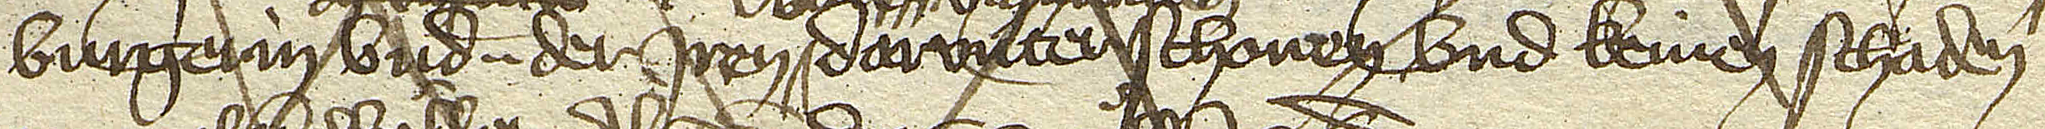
burgerin vnd ~ der Iren darvnter ſchonen vnd keinen ſchaden
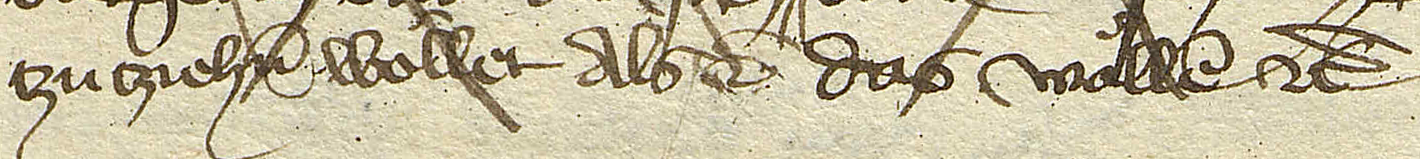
cʒu cʒiehn* wöllet Als ec* das wölle* ec*
